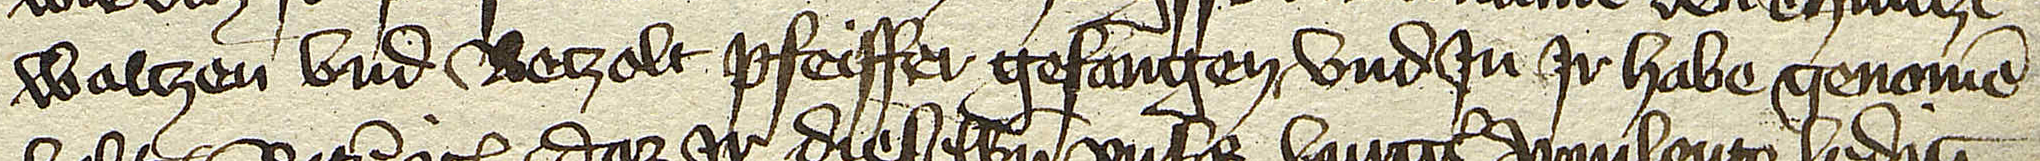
walcʒen vnd Becʒolt Pfeiffer gefangen vnd In Ir habe genome*
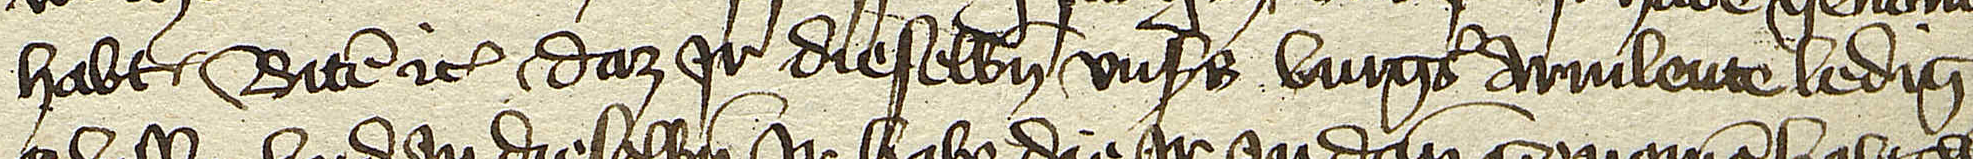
habt / Bite* ec* / daʒ Ir dieſelbn* vnſ*s burgs* Armleute ledig
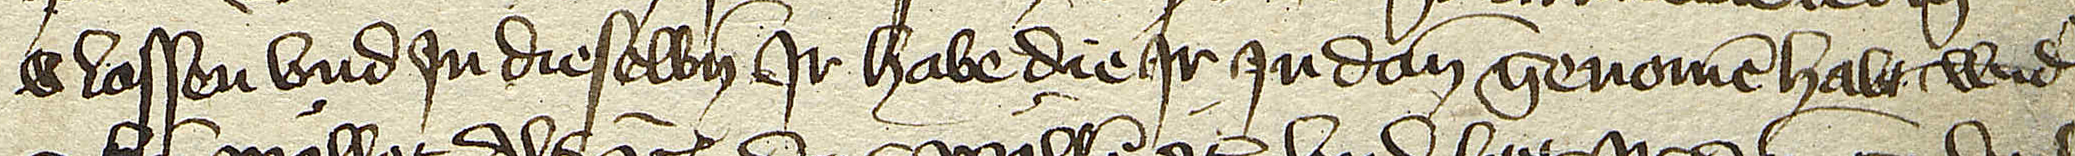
v laſſen vnd In dieſelbn* Ir habe die Ir In dan* genome* habt / wid*
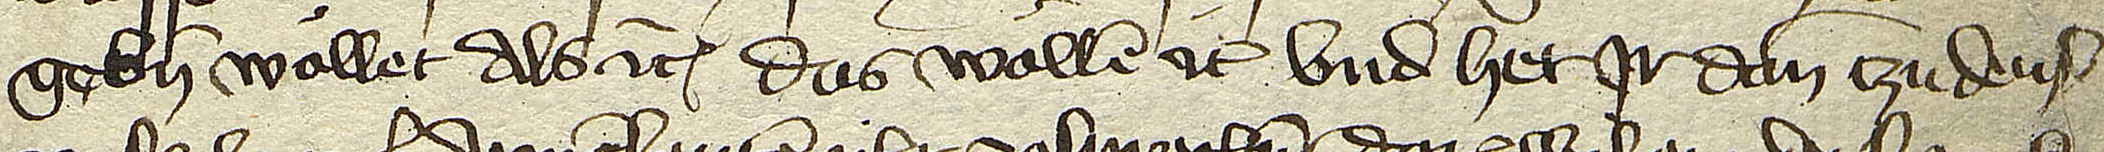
gebn* wöllet Als ec* das wölle ec* vnd her Ir dan* cʒu denſ*
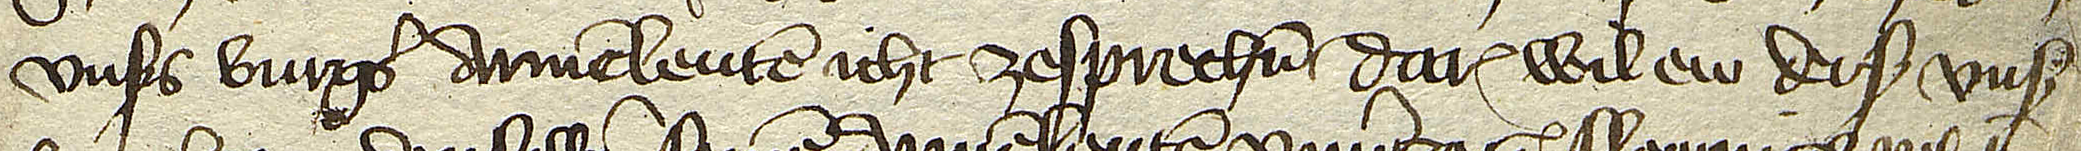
vnſ*s burgs* Armleute* icht cʒeſprechn* / dar* wil ew derſ* vnſ*
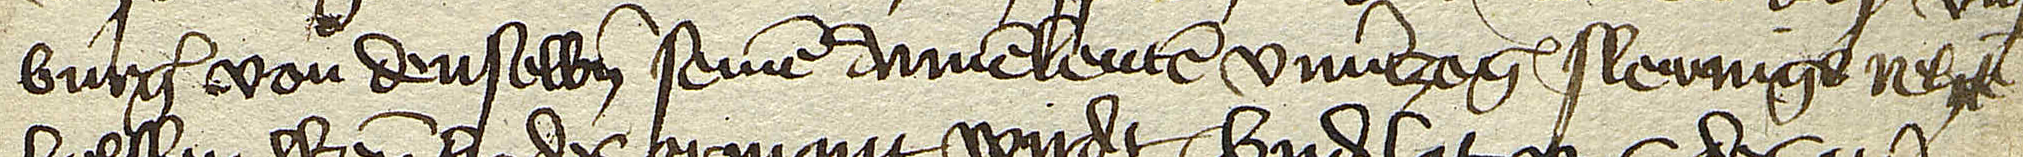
burg* von denſelbn* ſeine* Arme*leute* vnu*cʒog* ſlewnigs rehte*
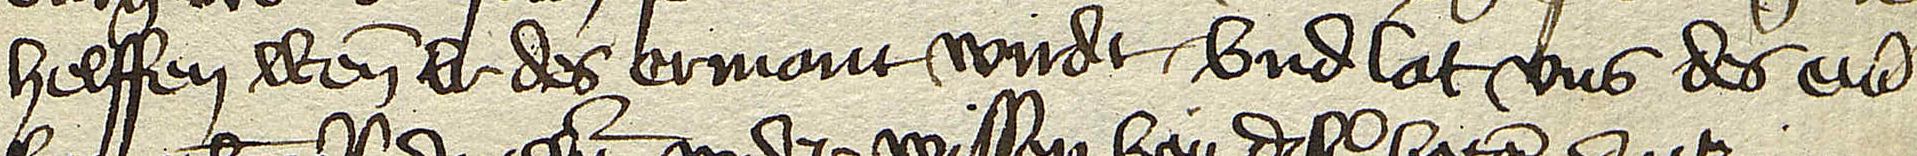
helffen wen* Er des ermant wirdt / vnd lat vns des ew*
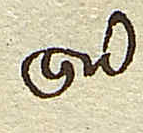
gn*
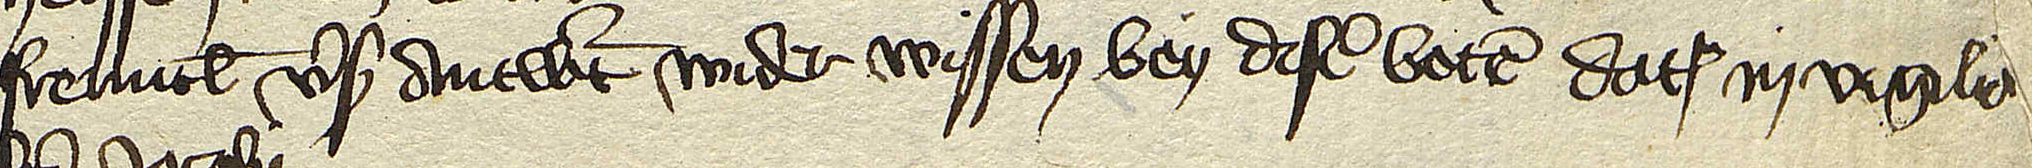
freuntl* v*ſ* Antwt* wider wiſſen bey diſe* bote* dat* iii* vigilia
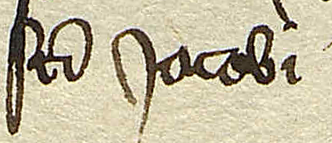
ſci* Iacobi
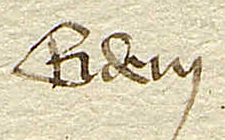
Eidem
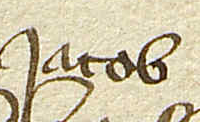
Iacob
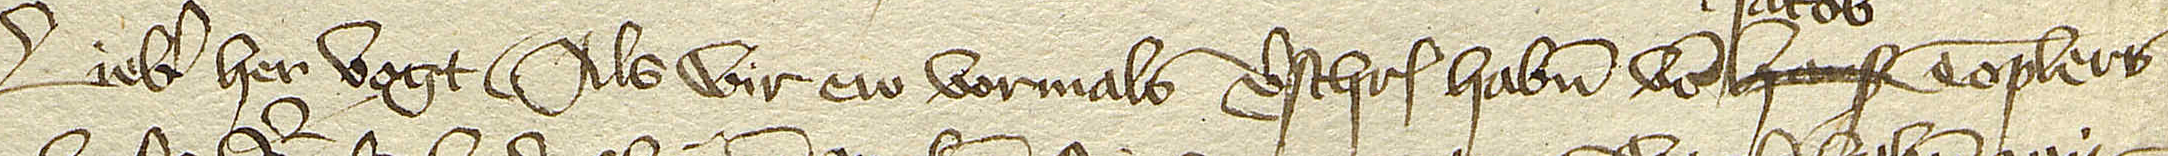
Lieb* her Vogt / Als wir ew vormals v*ſchr* habn* vo* hanſ* Toplers
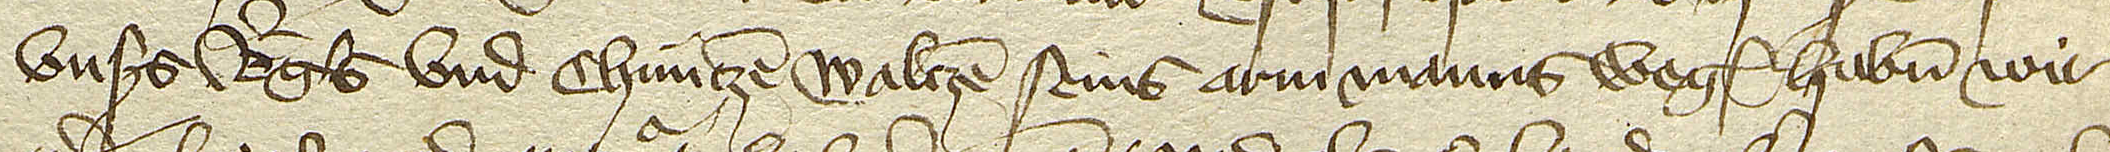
vnſ*s B*g*s vnd Chüncʒe* walcʒe* ſeins armmanns weg* habn* wir
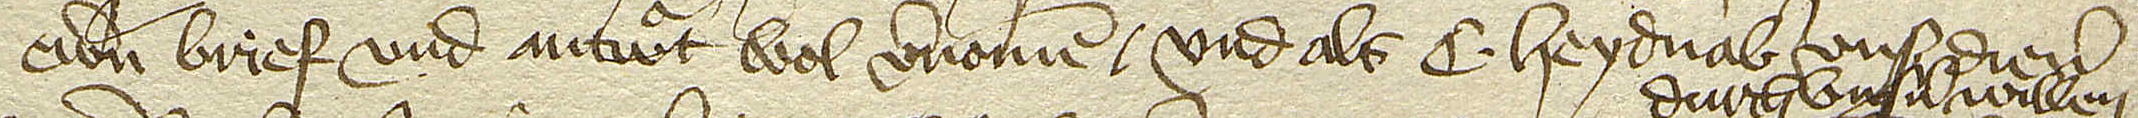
ew*n brief vnd antw*t wol v*nome* / vnd als C . heydnab* vnſ* dien*
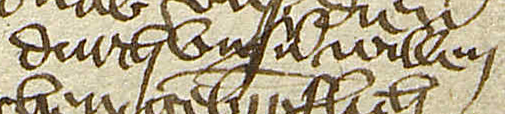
durch vnſn* willen
